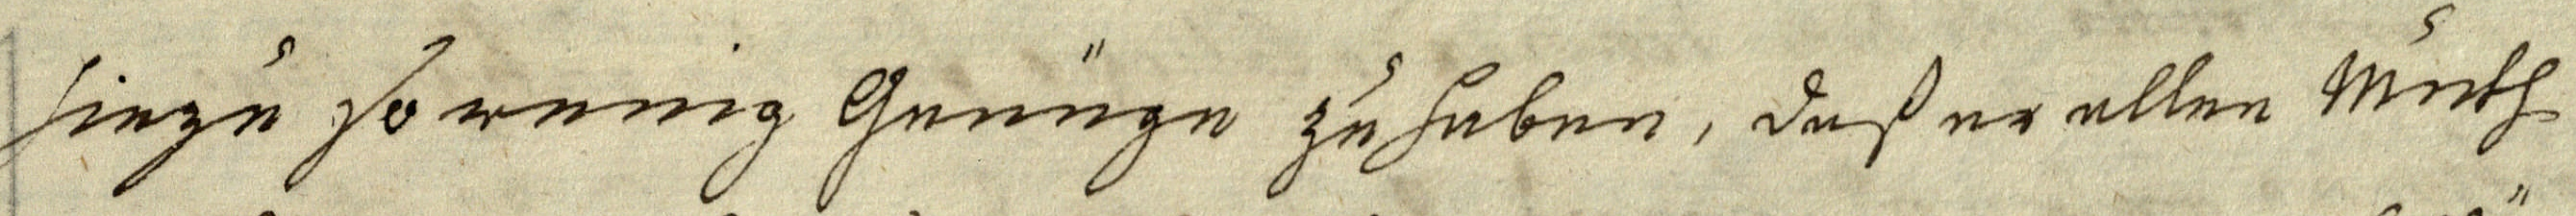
hiezu so wenig Genüge zuhaben, daß er allen Muth
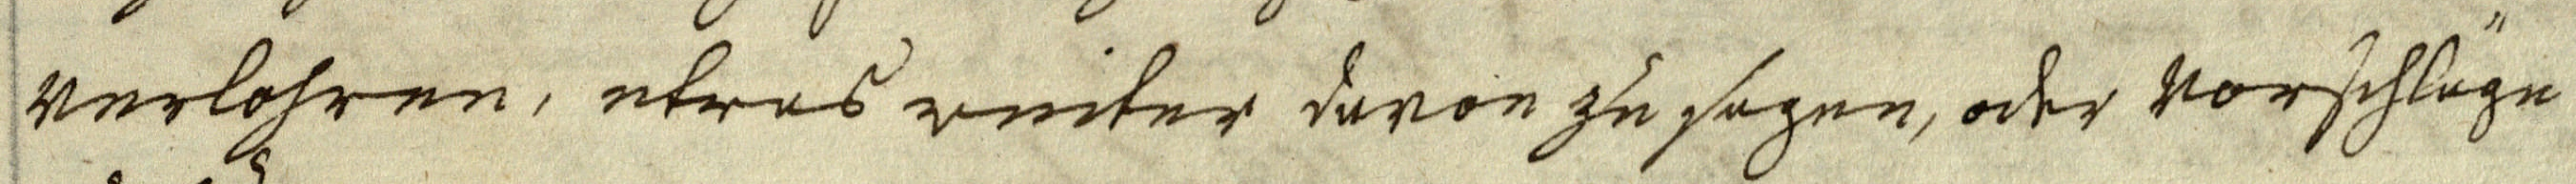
verlohren, etwas weiter davon zu sagen, oder Vorschläge
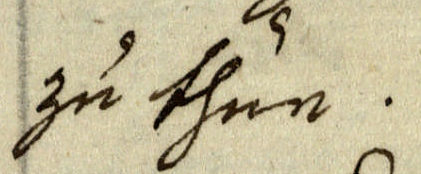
zu thun.
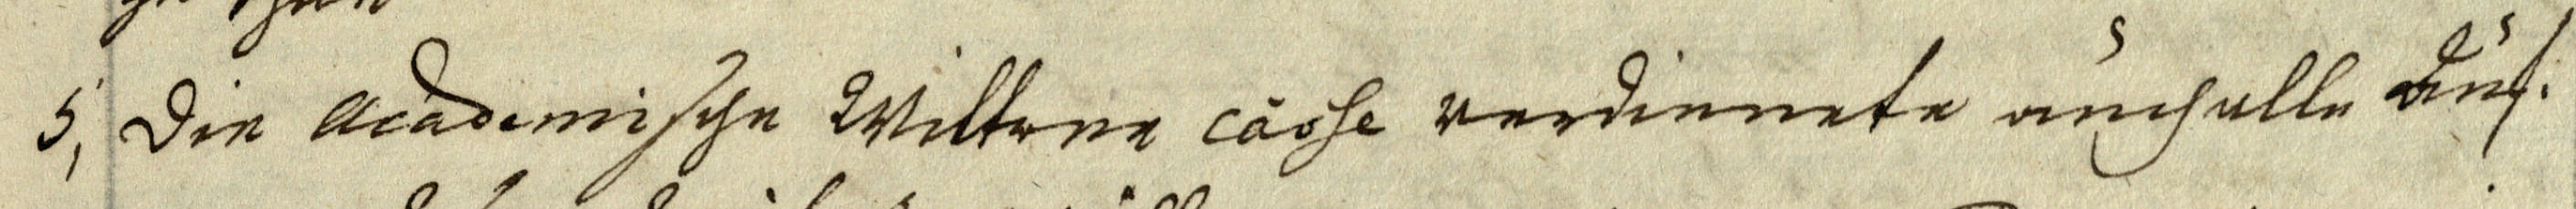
5. Die Academische Wittwen casse verdienete auch alle Auf¬
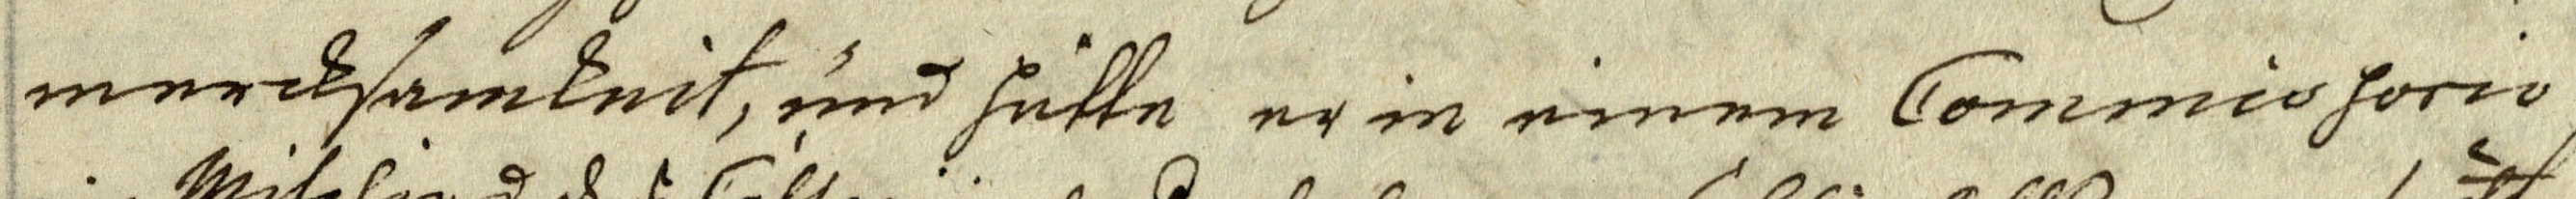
mercksamkeit, und hätte er ineinem Commissorio
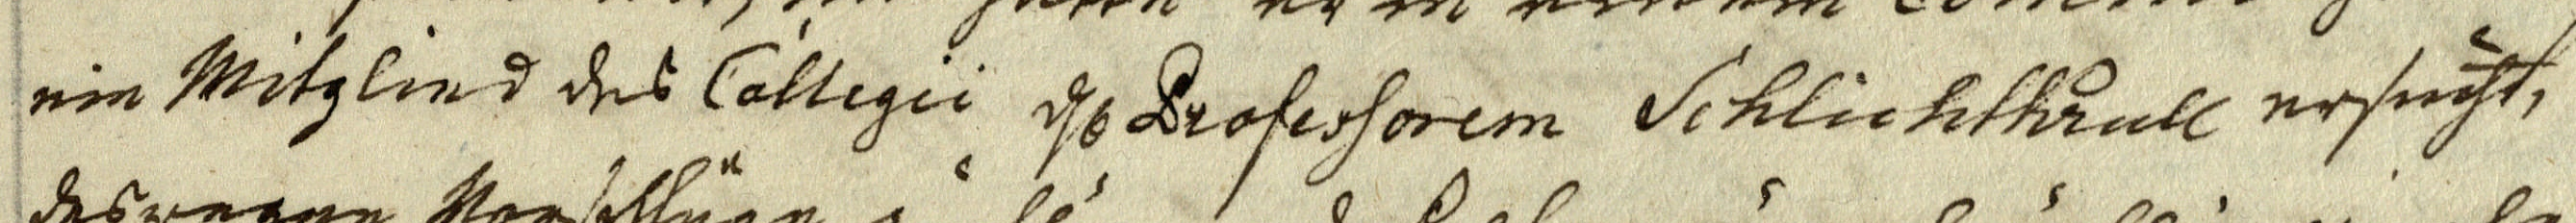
ein Mitglied des Collegii dh Professorem Schlichtkrull ersucht,
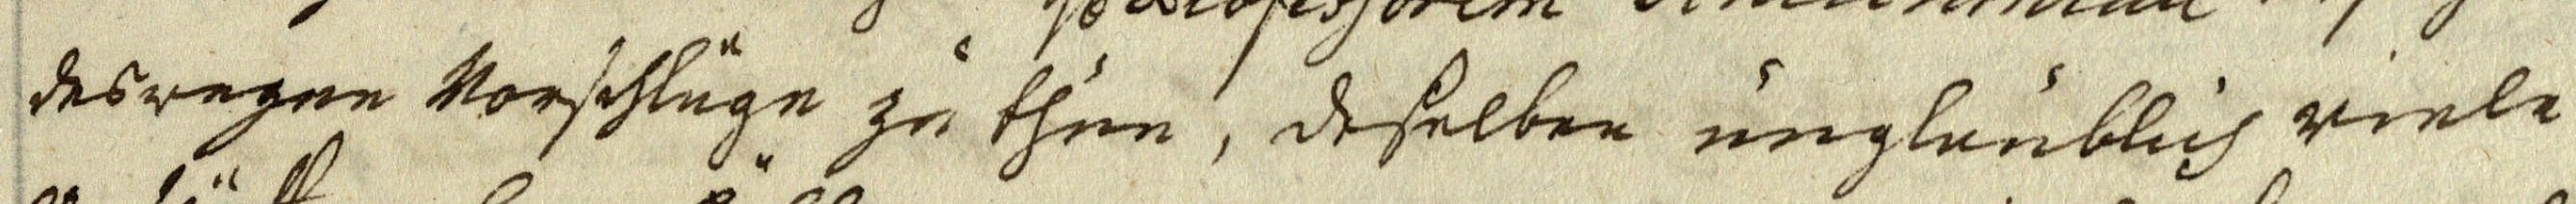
deswegen Vorschläge zu thun, deßelben unglaublich viele
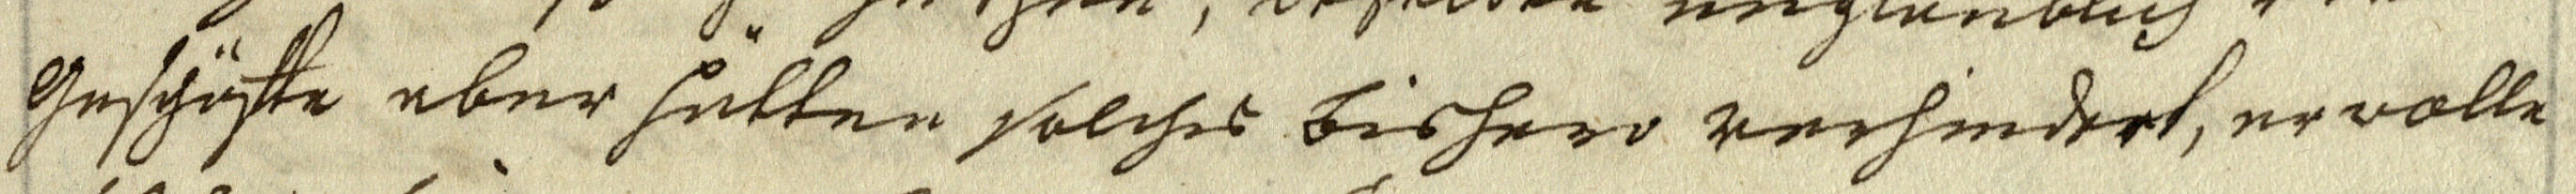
Geschäfte aber hätten solches bisher verhindert, er wolle
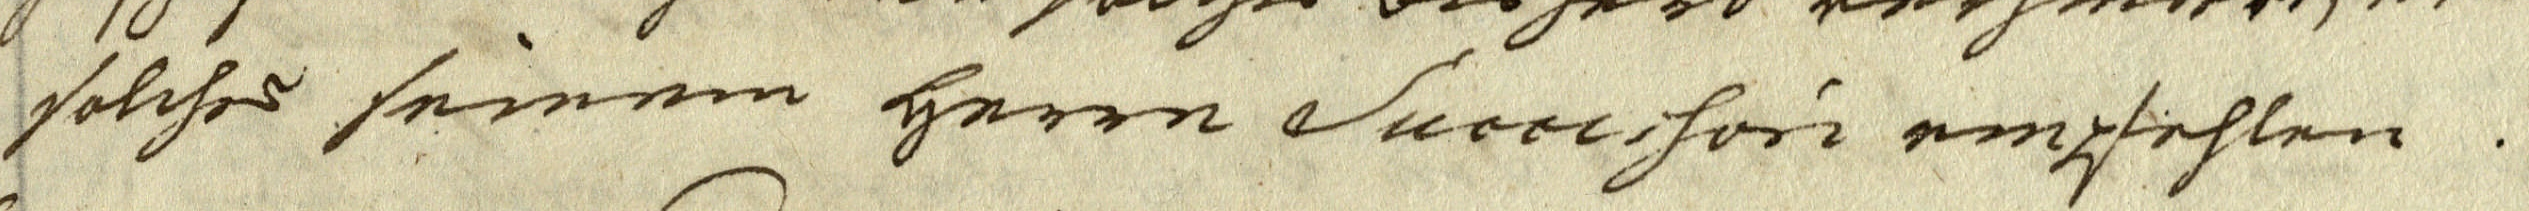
solches seinem Herrn Successori empfehlen.
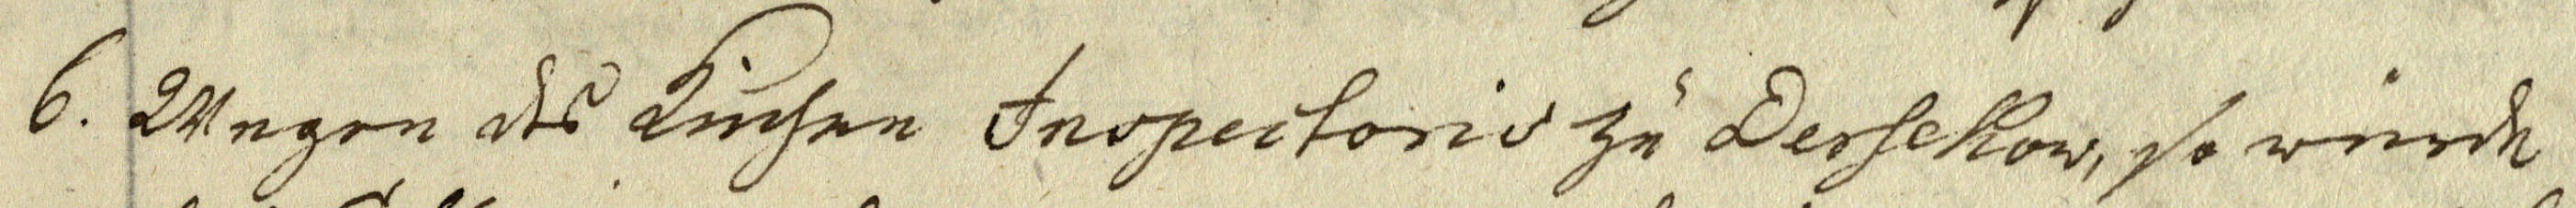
6. Wegen des Kirchen Inspectoris zu Dersekow, so würde
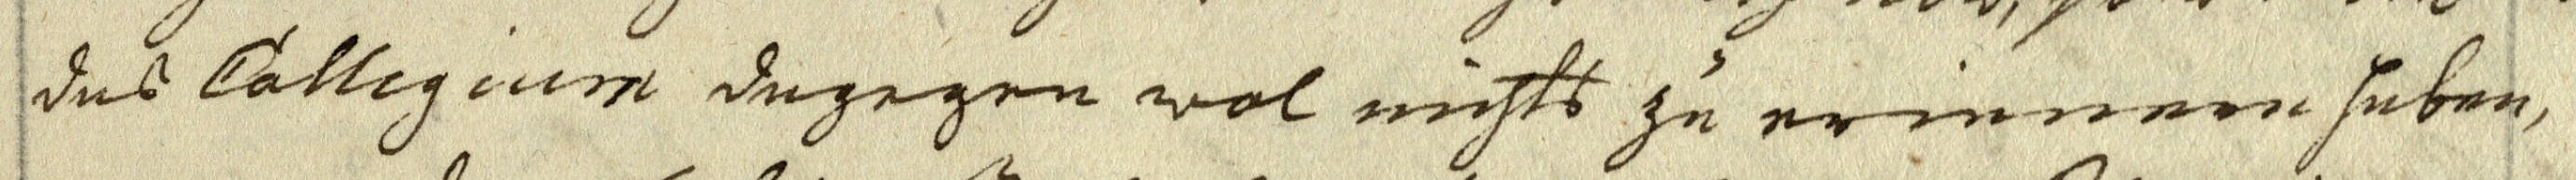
das Collegium dagegen wol nichts zu erinnern haben,
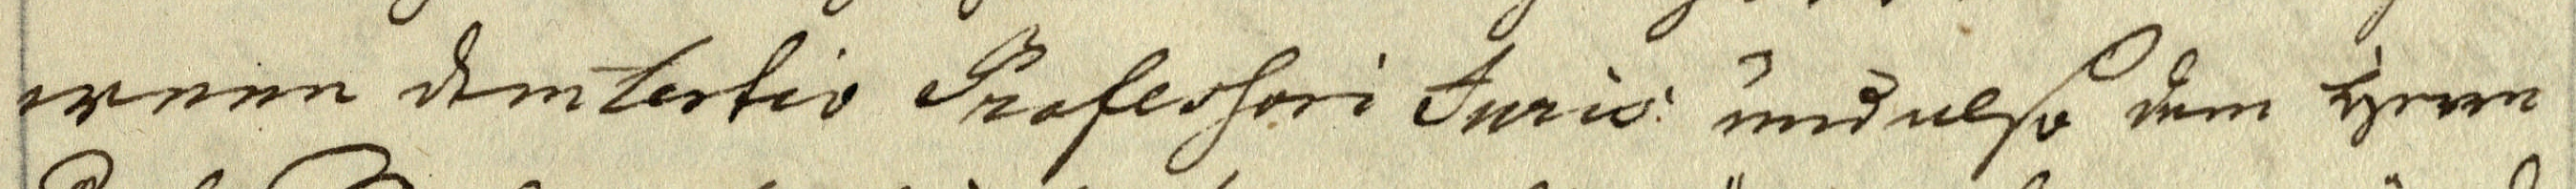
wenn dem tertio Professori Juris und also dem Herrn
